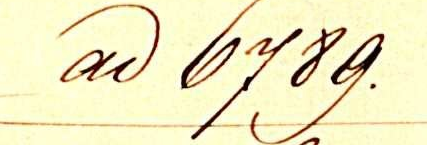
ad 6789/
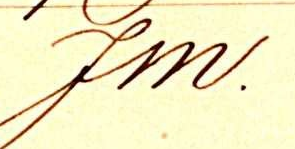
JM
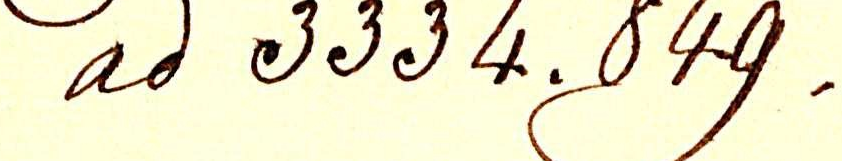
ad 3334/849
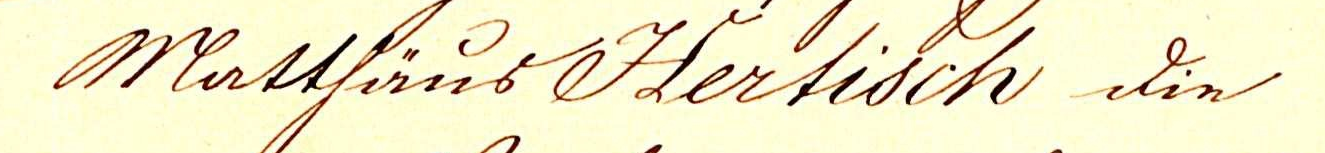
Matthäus Hertisch die
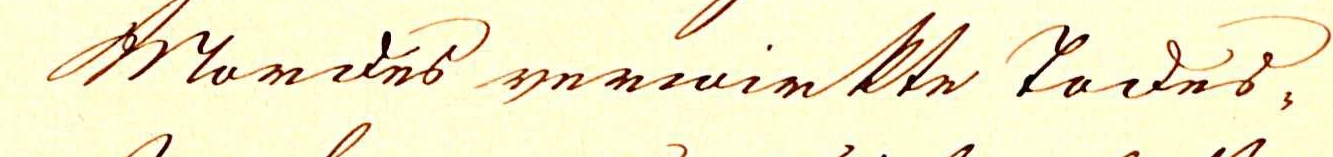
Mordes verwirkte Todes¬
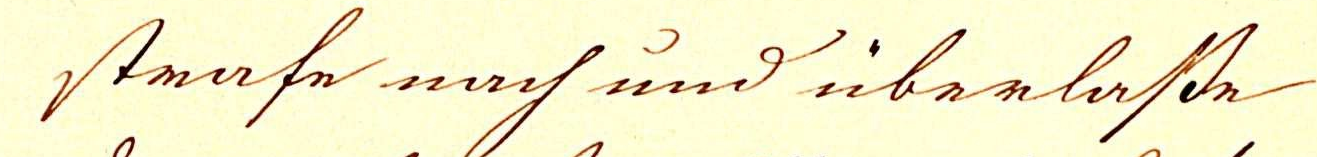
strafe nach, und überlasse
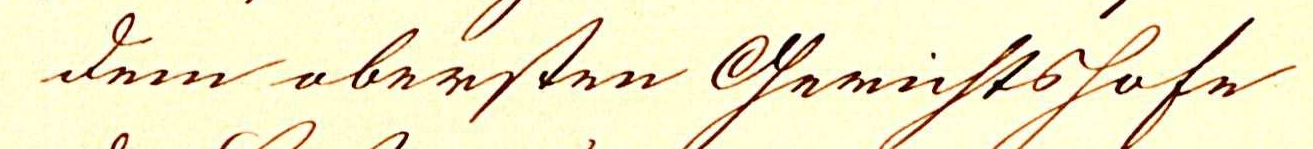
dem Obersten Gerichtshofe
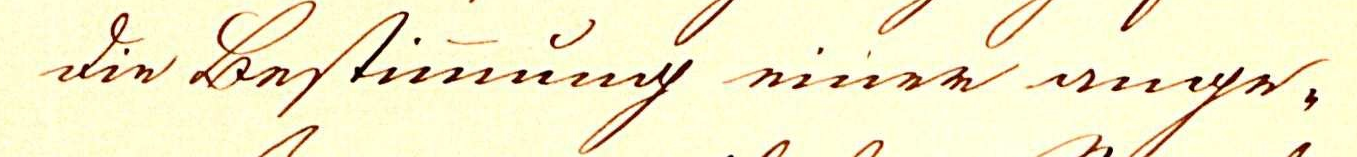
die Bestimmung einer ange¬
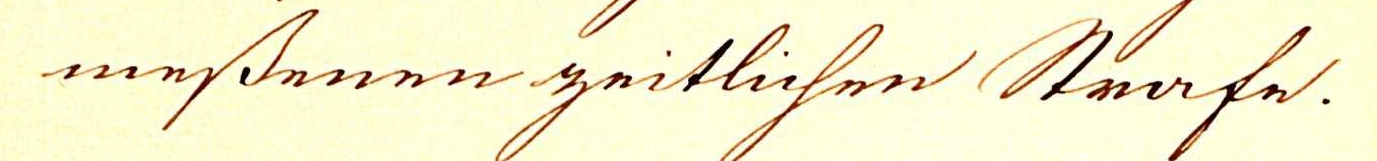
messenen zeitlichen Strafe.
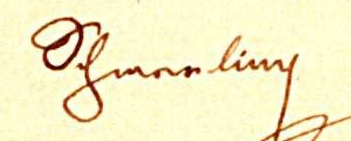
Schmerling
